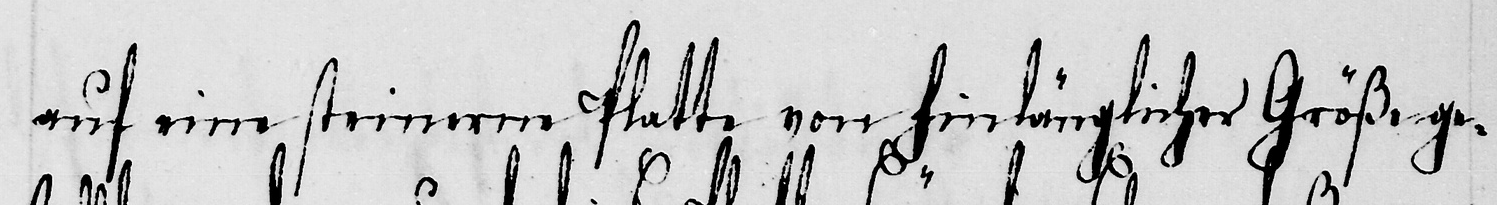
auf eine steinerne Platte von hinlänglicher Größe ge¬
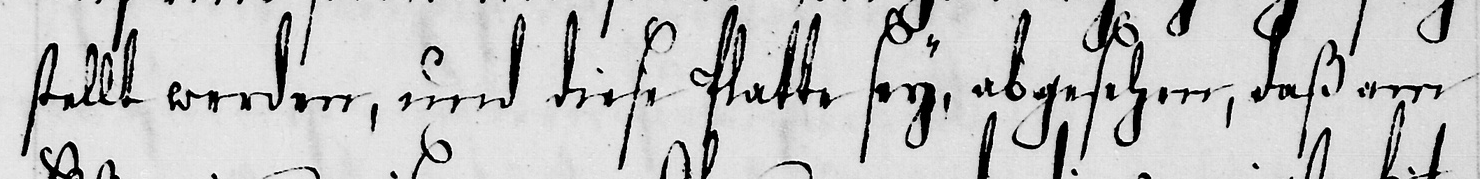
tellt werden, und diese Platte sey, abgesehen, daß am
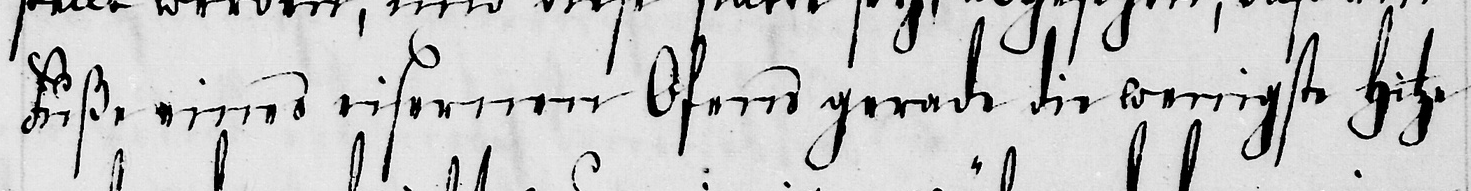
Fuße eines eisernen Ofens gerade die wenigste Hitze
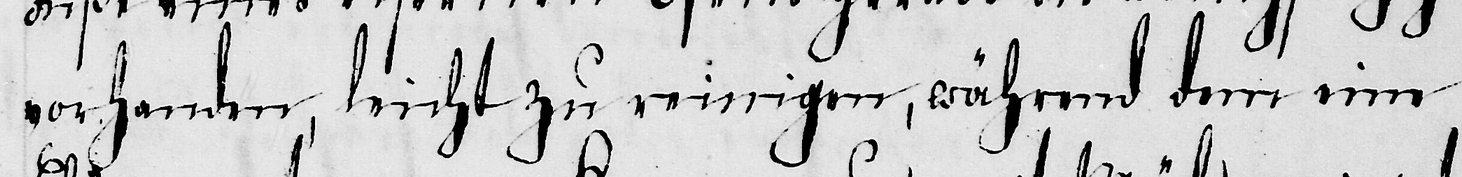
vorhanden, leicht zu reinigen, während dem eine
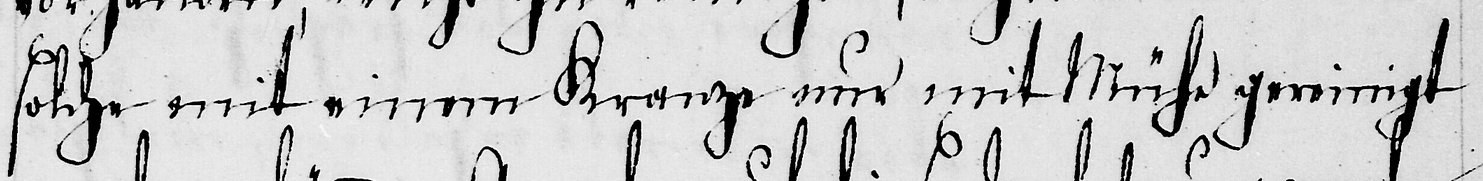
solche mit einem Kranze nur mit Mühe gereinigt
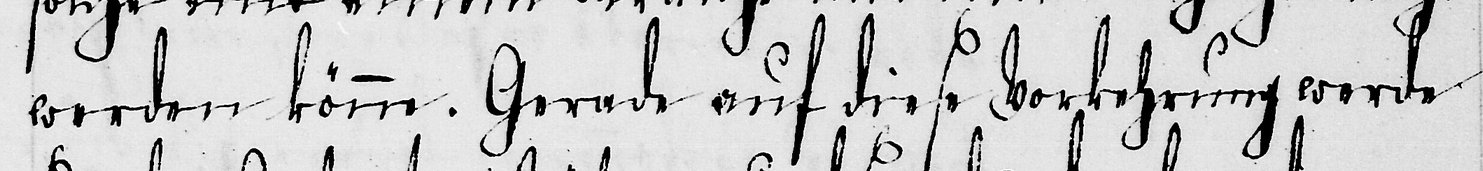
werden könne. Gerade auf diese Vorkehrung werde
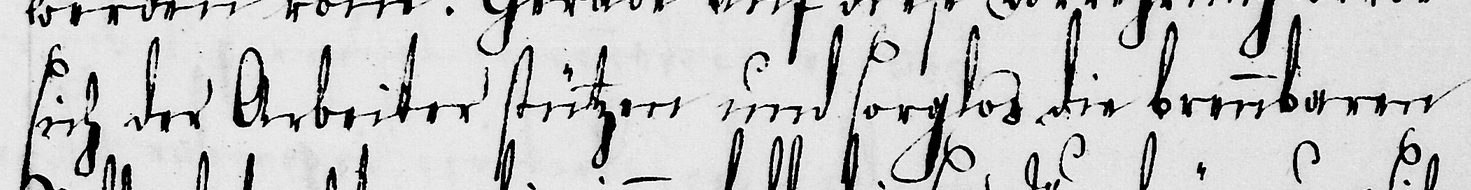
sich der Arbeiter stützen und sorglos die brennbaren
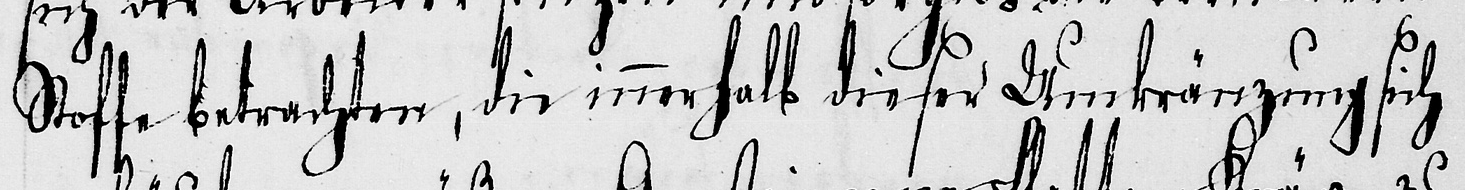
toffe betrachten, die innerhalb dieser Umkränzung sich
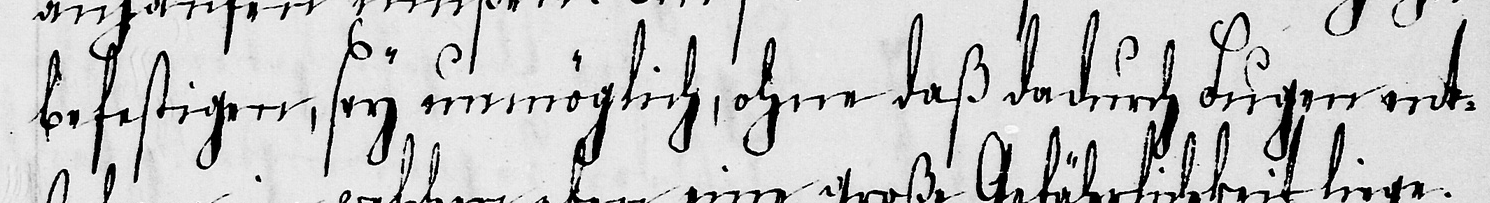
befestigen, sey unmöglich, ohne daß dadurch Fugen ent¬
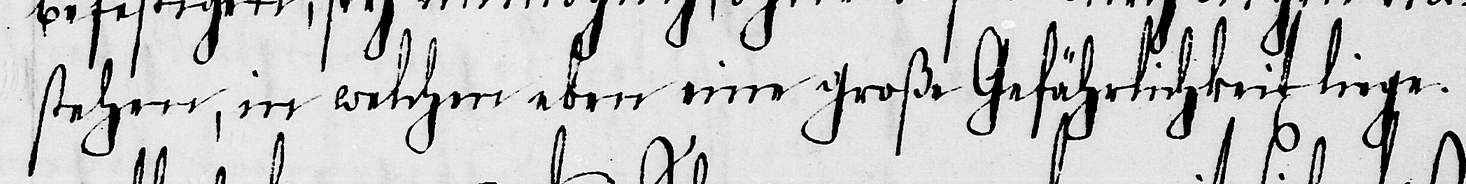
stehen, in welchen eben eine große Gefährlichkeit liege.
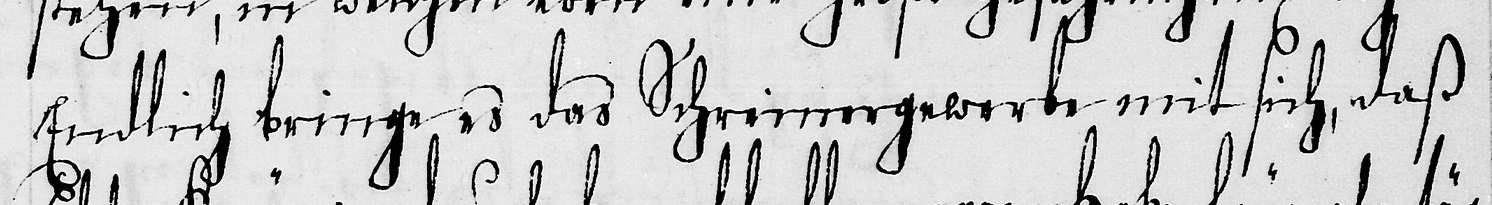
Endlich bringe es das Schreinergewerbe mit sich, daß
